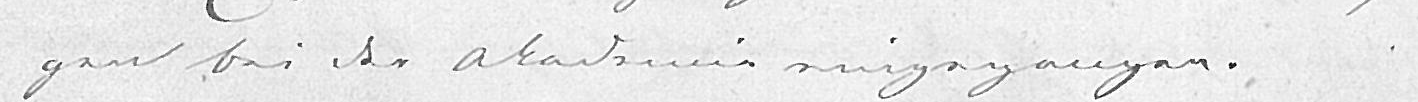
gen bei der Akademie eingegangen.
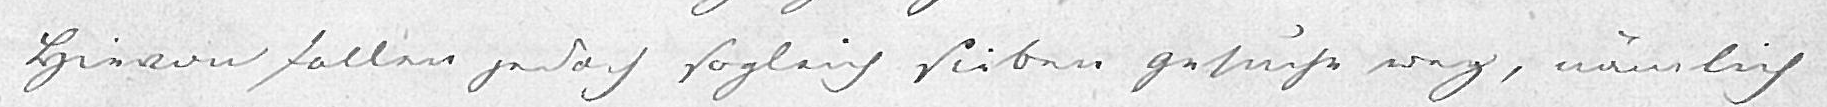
Hiervon fallen jedoch sogleich sieben Gesuche weg, nämlich
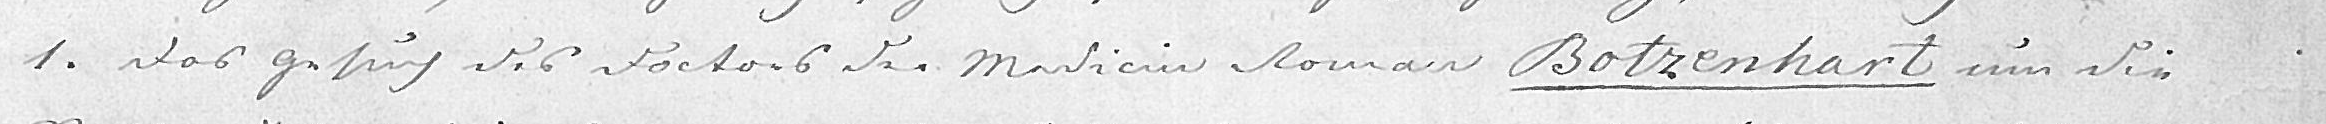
1. Das Gesucht des Doctors der Medicin Roman Botzenhart um die
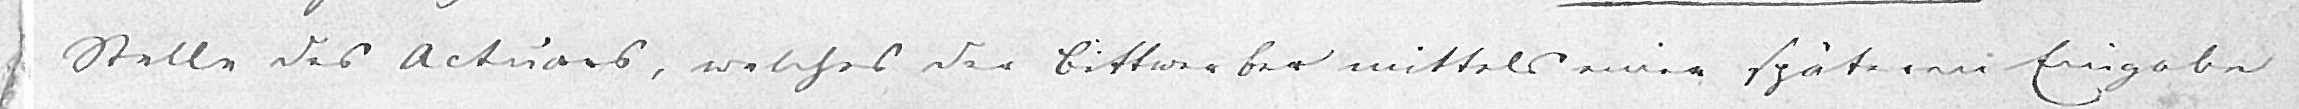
Stelle des Actuars, welches der Bittwerber mittels einer späteren Eingabe
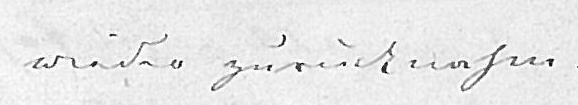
wieder zurücknahm.
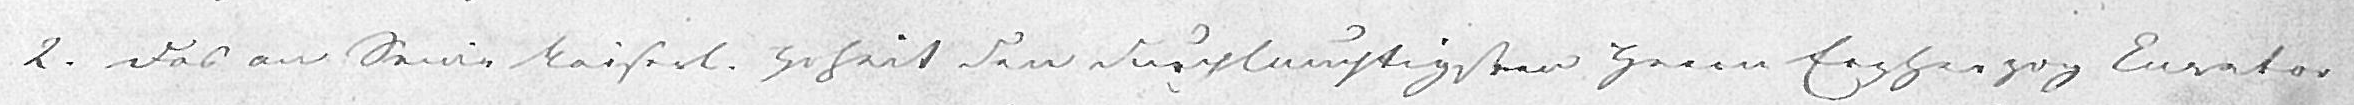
2. Das an Seine kaiserl. Hoheit den durchlauchtigsten Herrn Erzherzog Curator
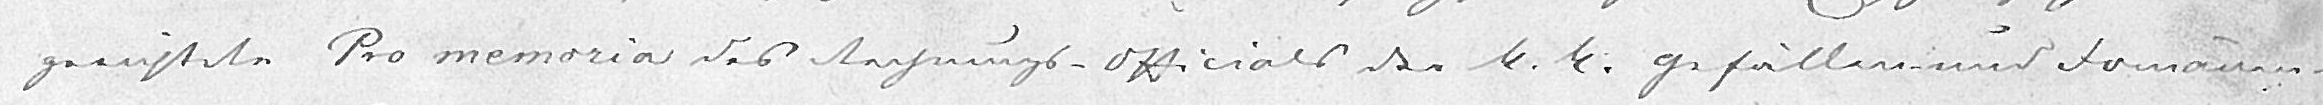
gerichtete Pro Memoria des Rechnungs-Officials der k.k. Gefällen- und Domänen-
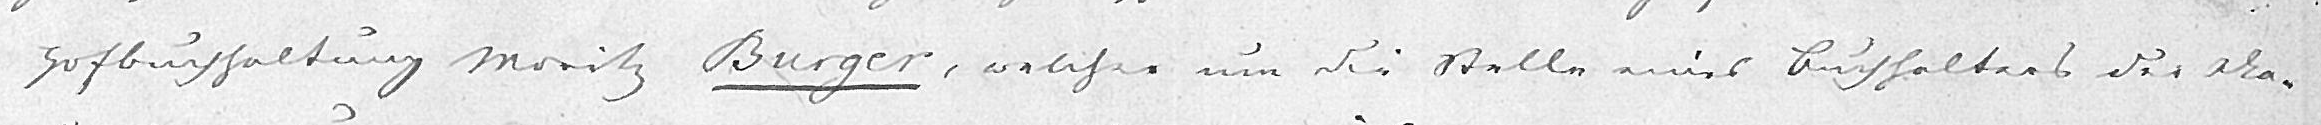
Hofbuchhaltung Moritz Burger, welcher um die Stelle eines Buchhalters der Aka-
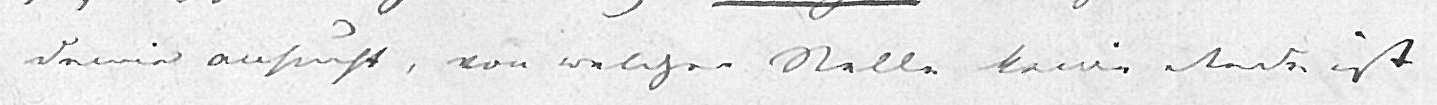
demie ansucht, von welcher Stelle keine Rede ist.
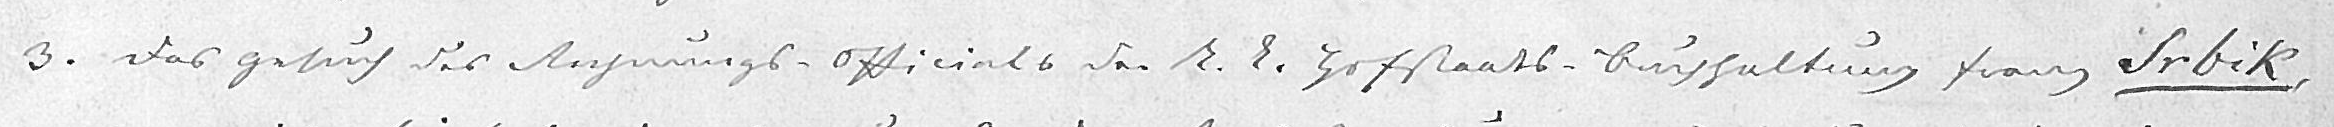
3. Das Gesucht des Rechnungs-Officials der k.k. Hofstaats-Buchhaltung Franz Srbik,
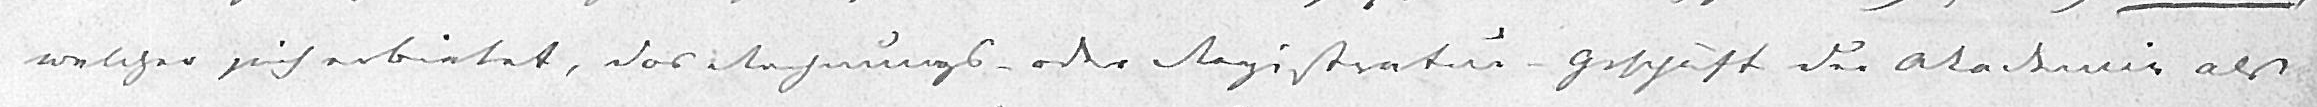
welcher sich erbietet, das Rechnungs- oder Registratur Geschäft der Akademie als
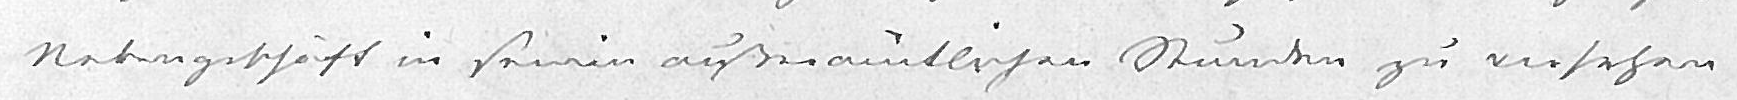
Nebengeschäft in seinen außerämtlichen Stunden zu versehen.
